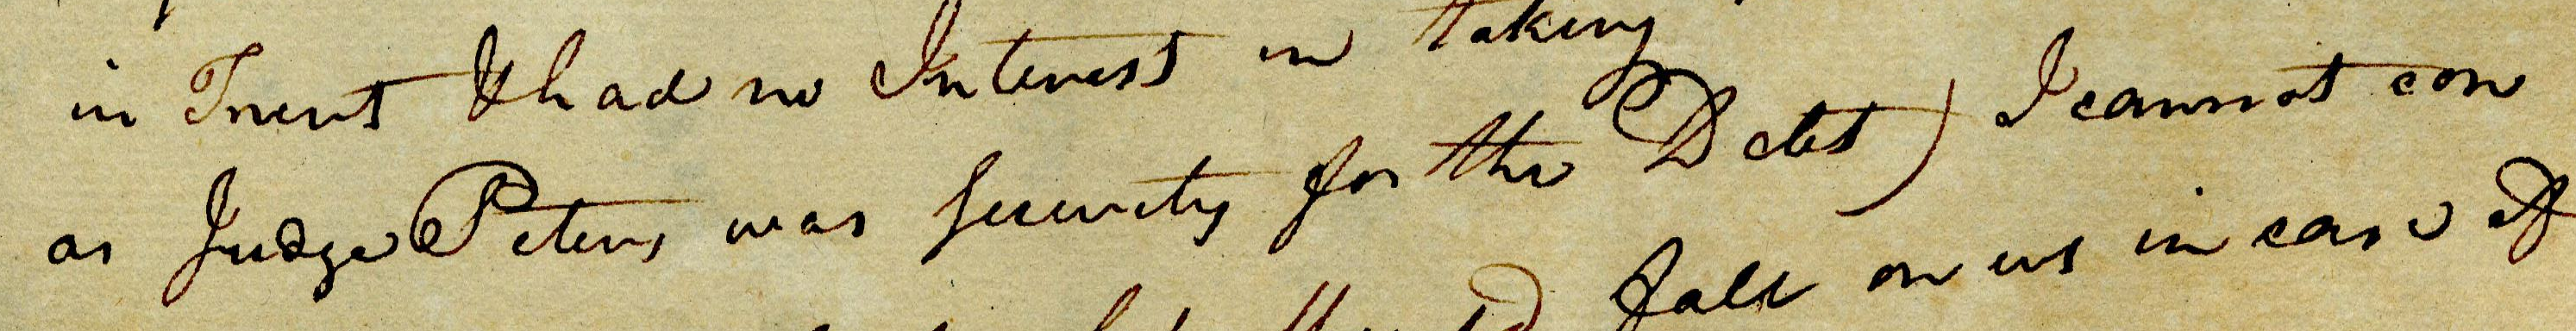as Judge Peters was security for the Debt) I cannot con
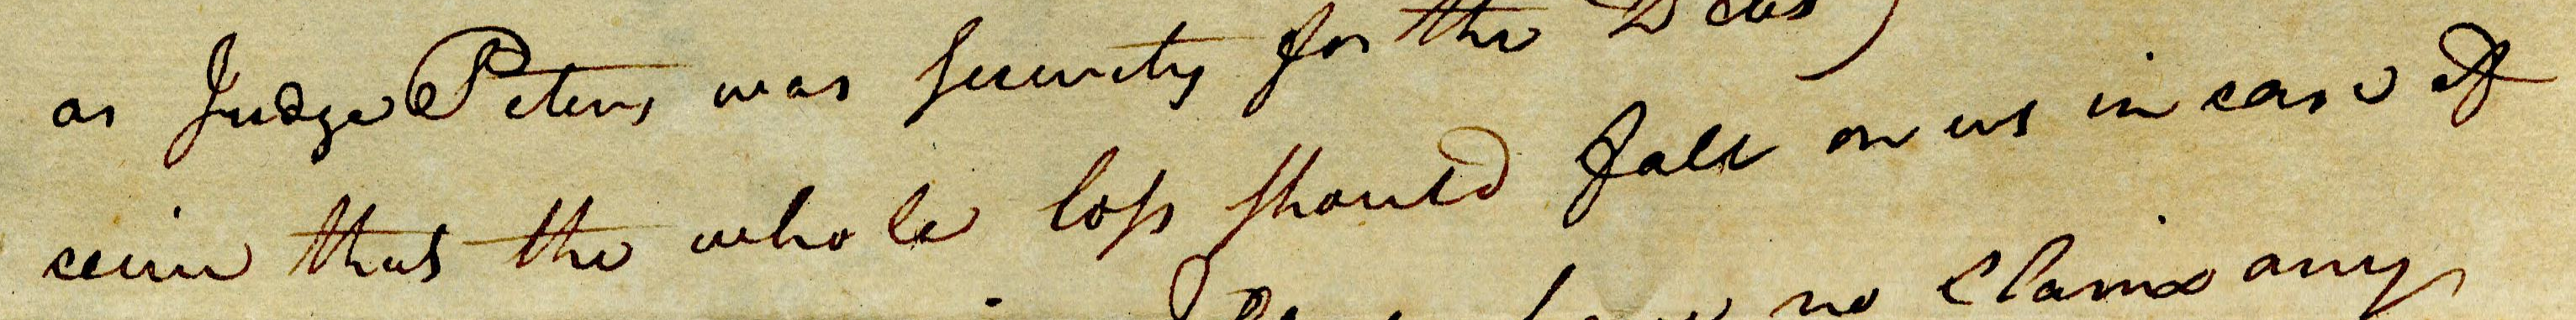ceive that the whole loss should fall on us in case of
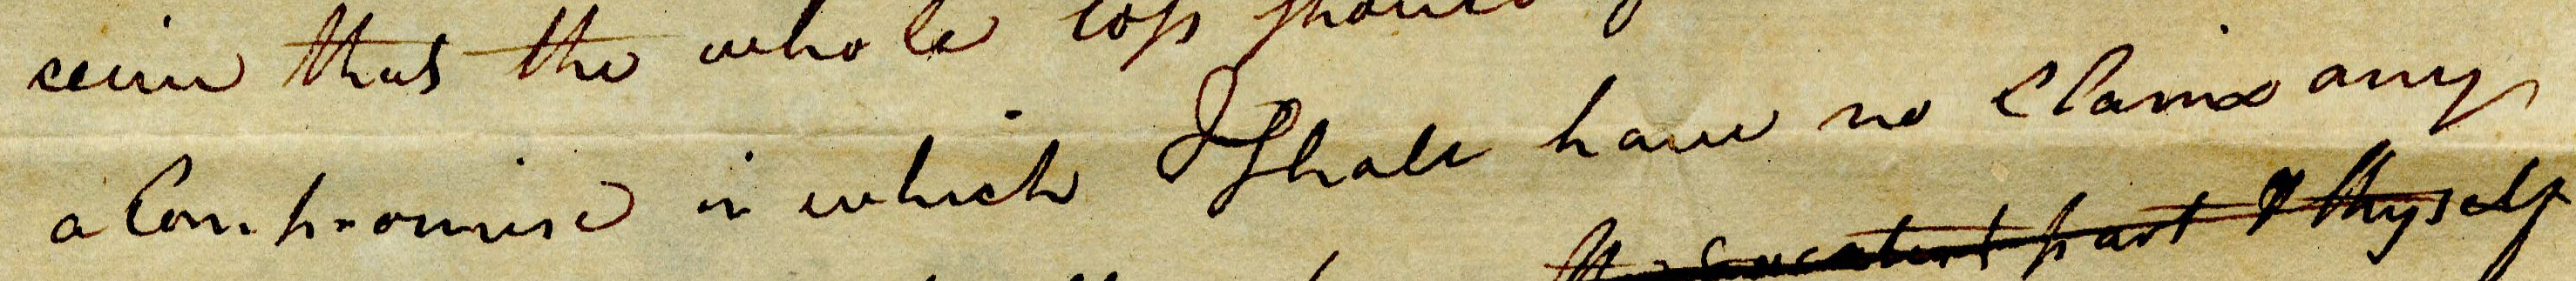a Compromise in which I shall have no claims any
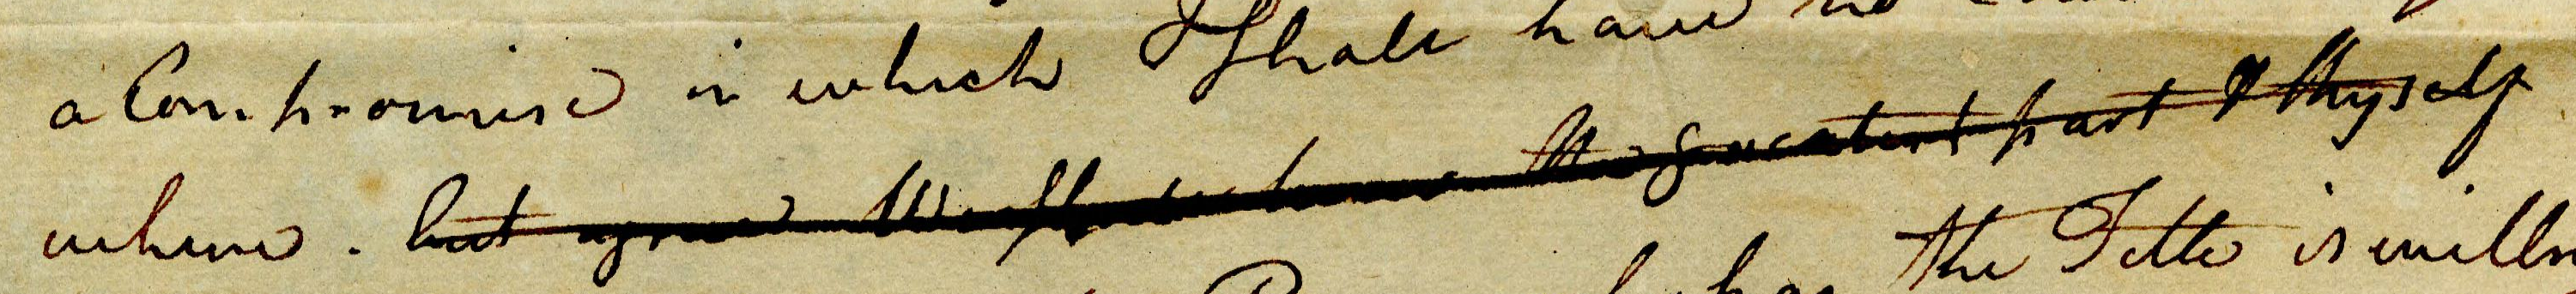where. [___________________________________________]
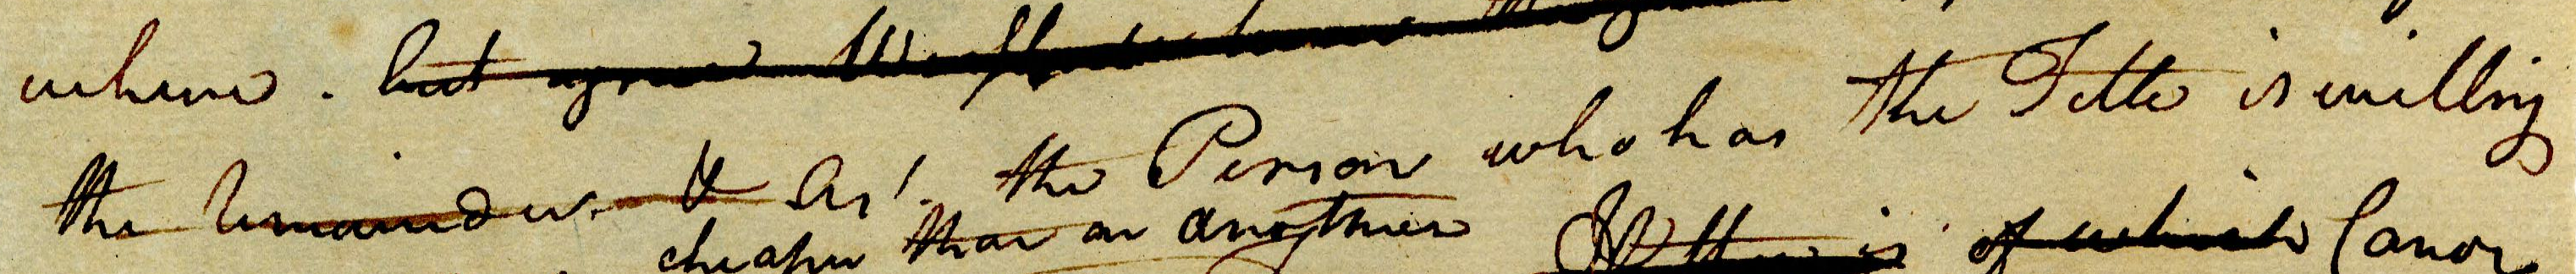[the remainder &] As the Person who has the Title is willing
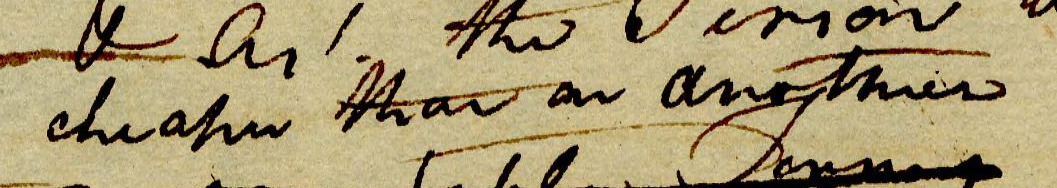cheaper than an another
